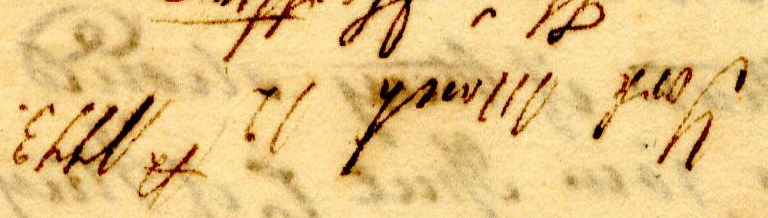York March 12^th 1773.
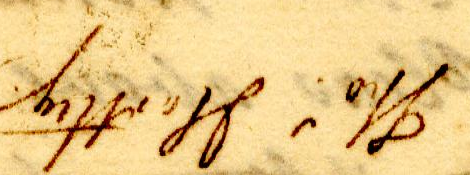Tho^s. Hartley
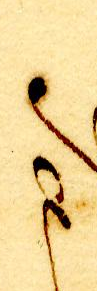To
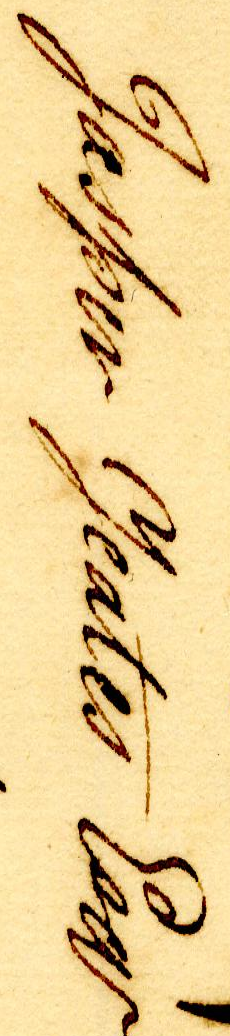Jasper Yeates Esq^r
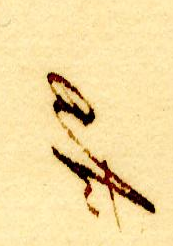at
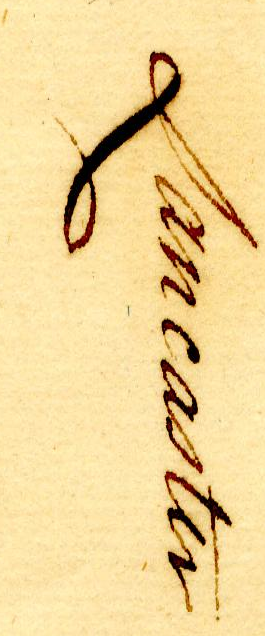Lancaster
